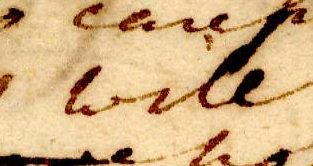will
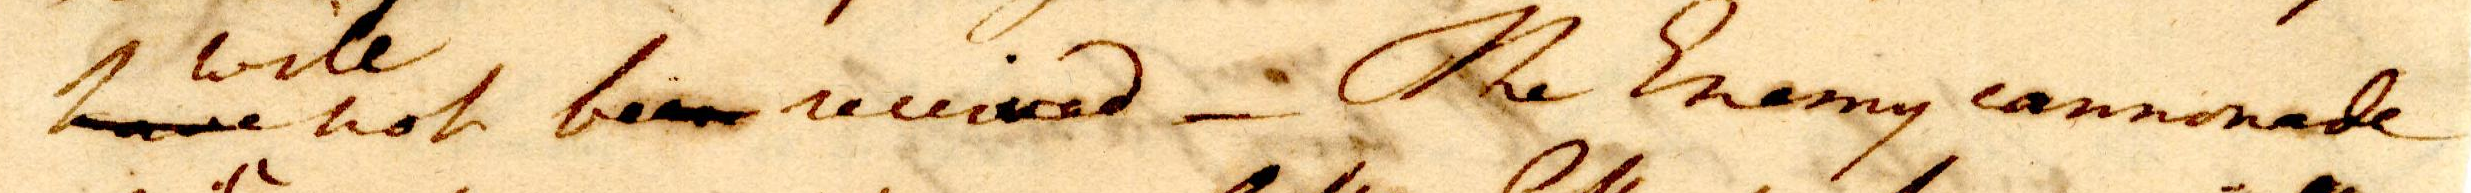have not been received. The Enemy cannonade
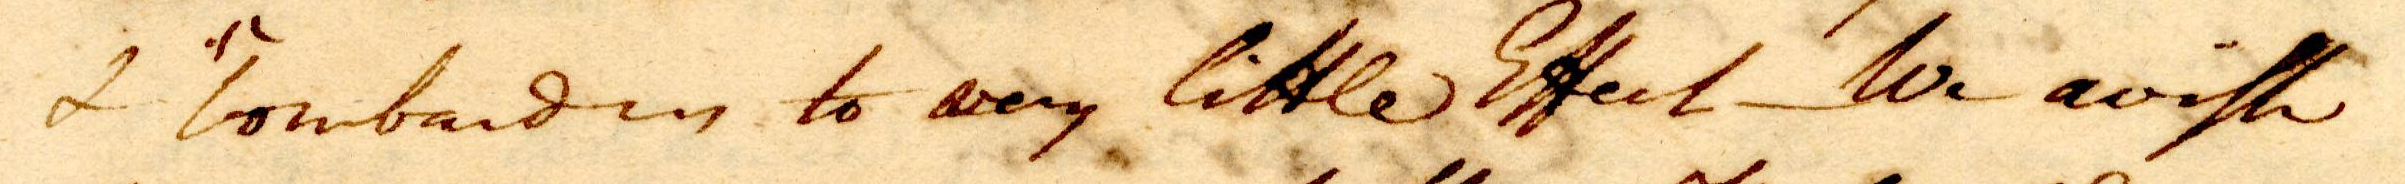& bombardiers to very little Effect. We wish
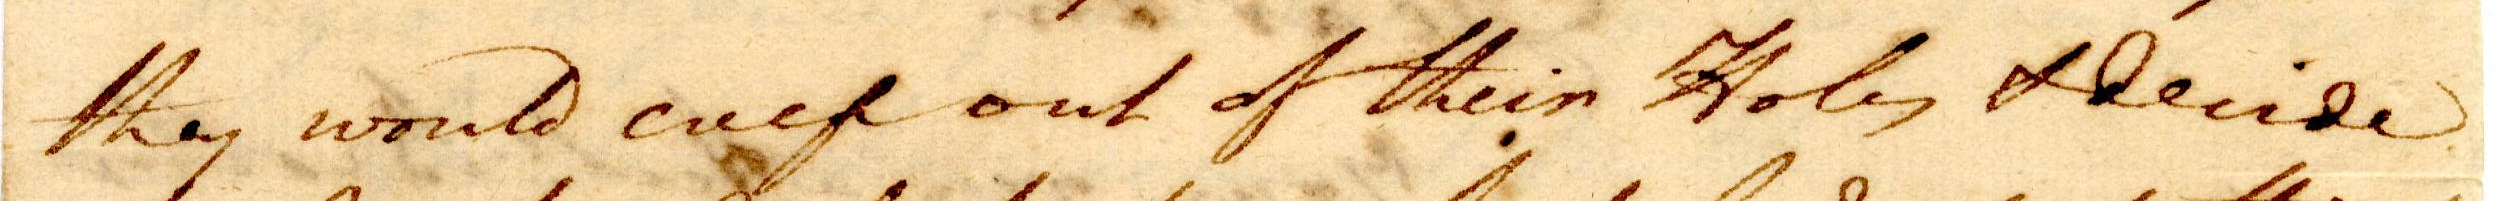they would cuef out of their Holes & Decide
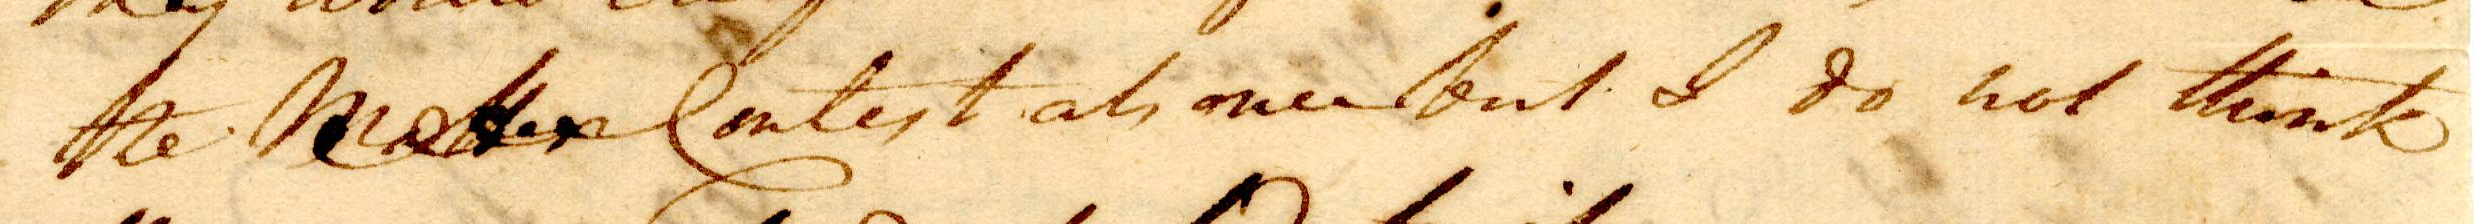the Matter Contest at once but I do not think
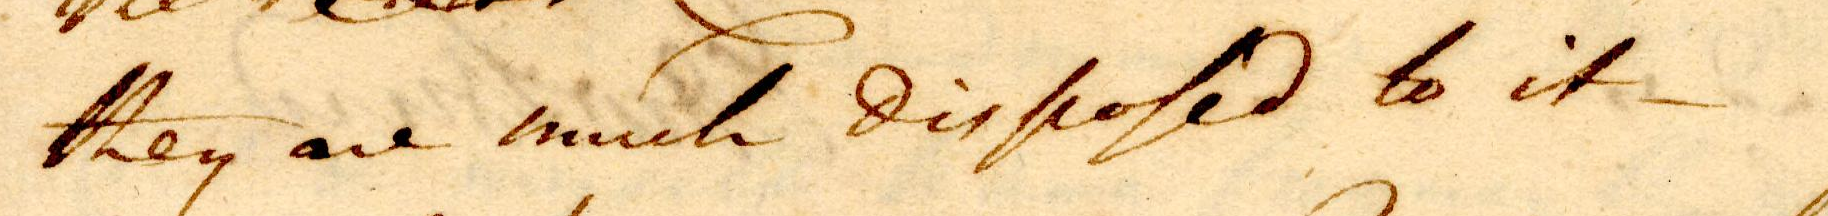they are much disposed to it.
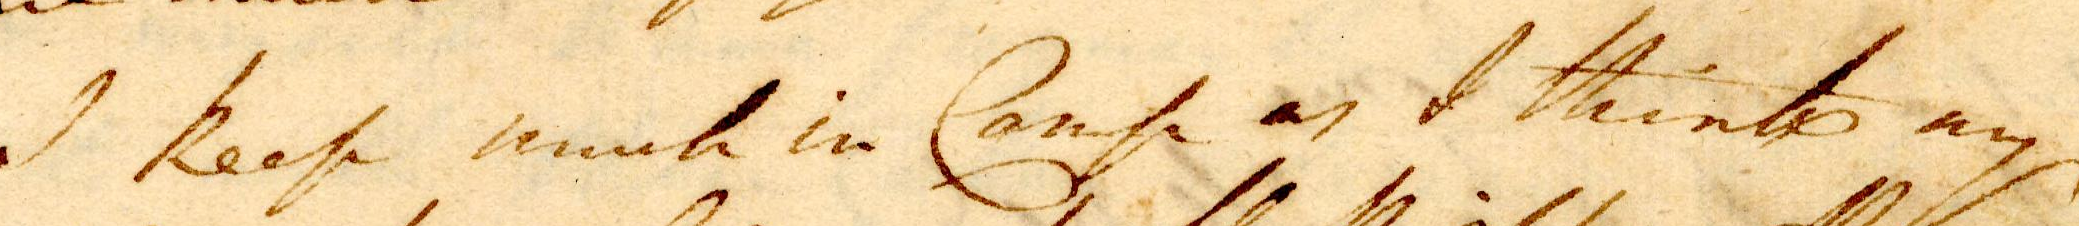I keep much in Camp as I think my
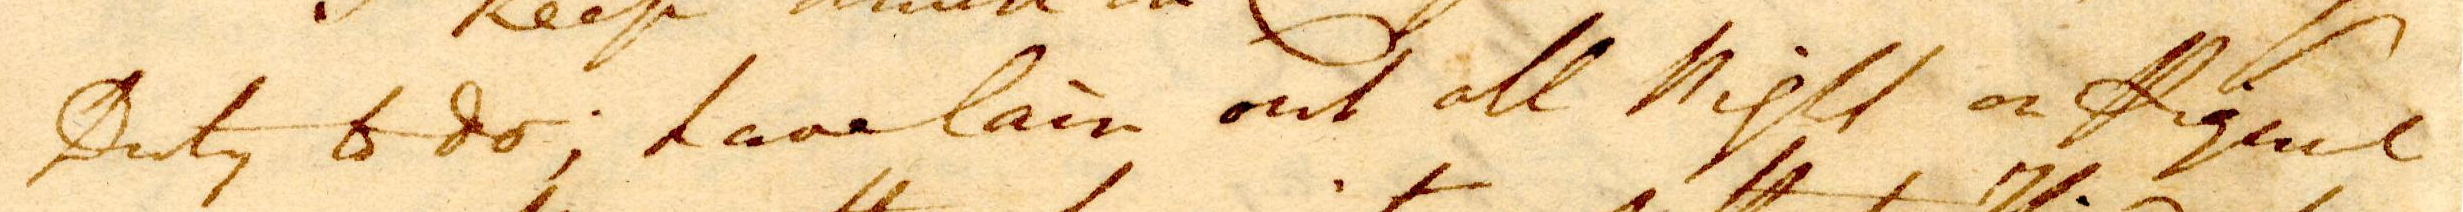Duty to do; have lain out all Night or Piquet
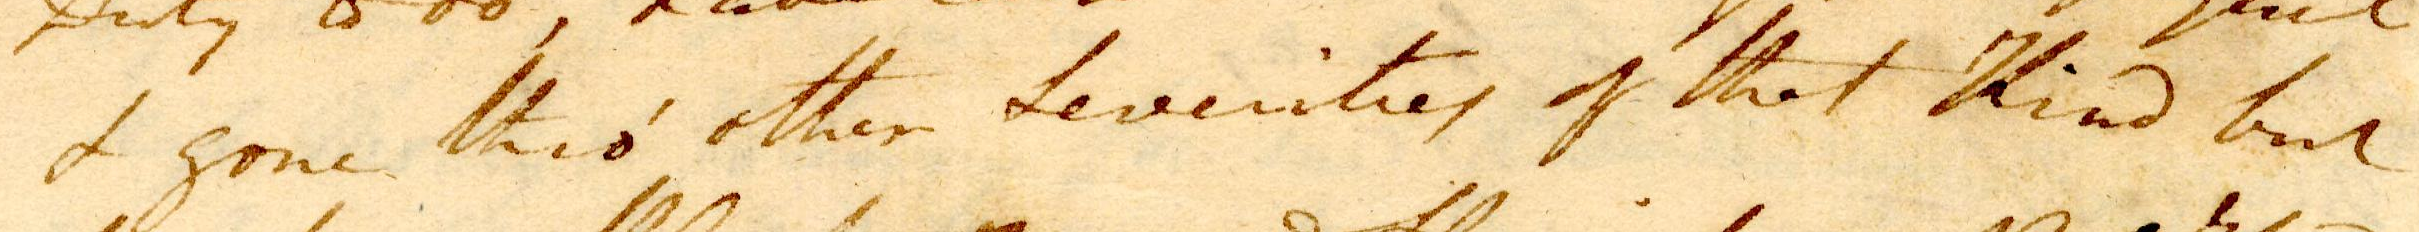& gone thro' other Severities of that Kind but
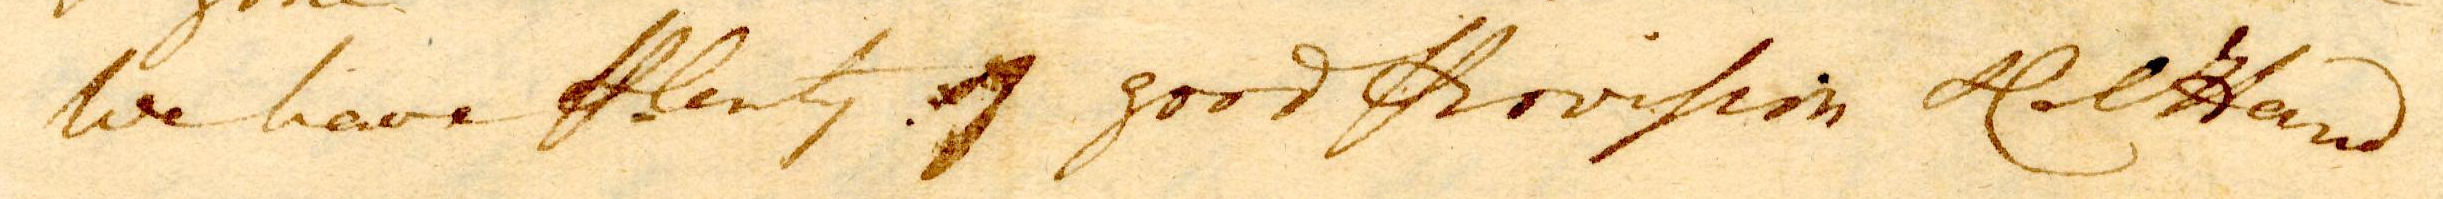We have Plenty of good provision & ColHand
